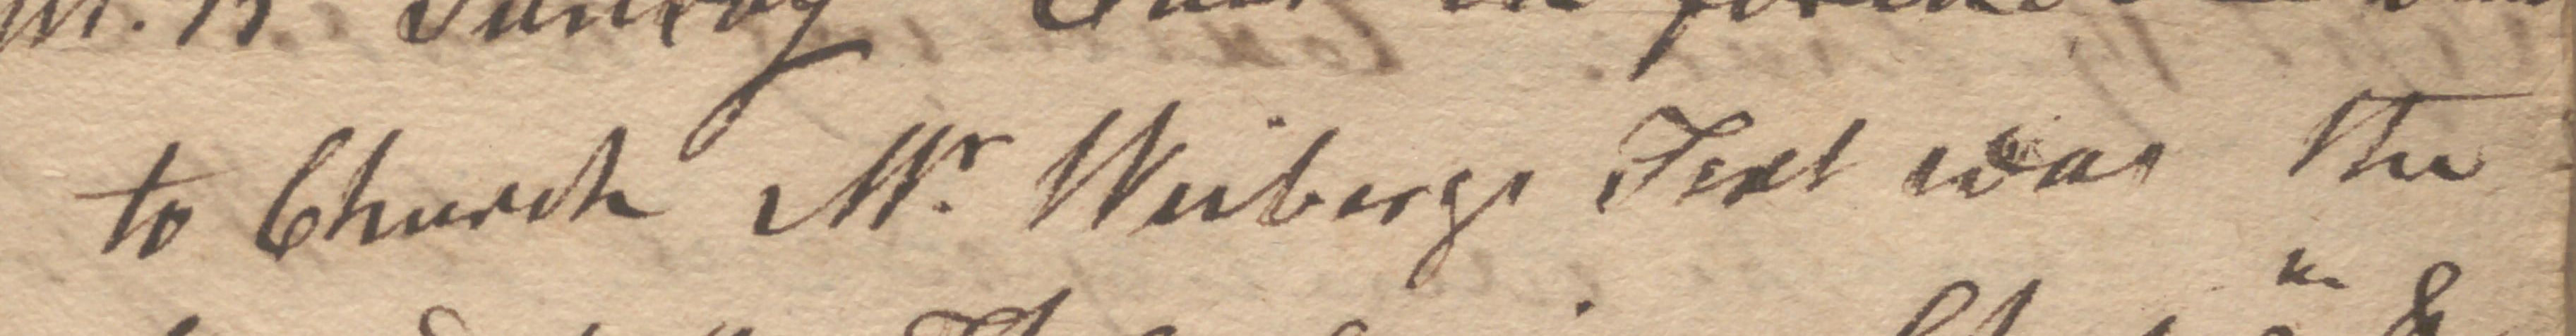to Church M^r. Weibergs Text was the
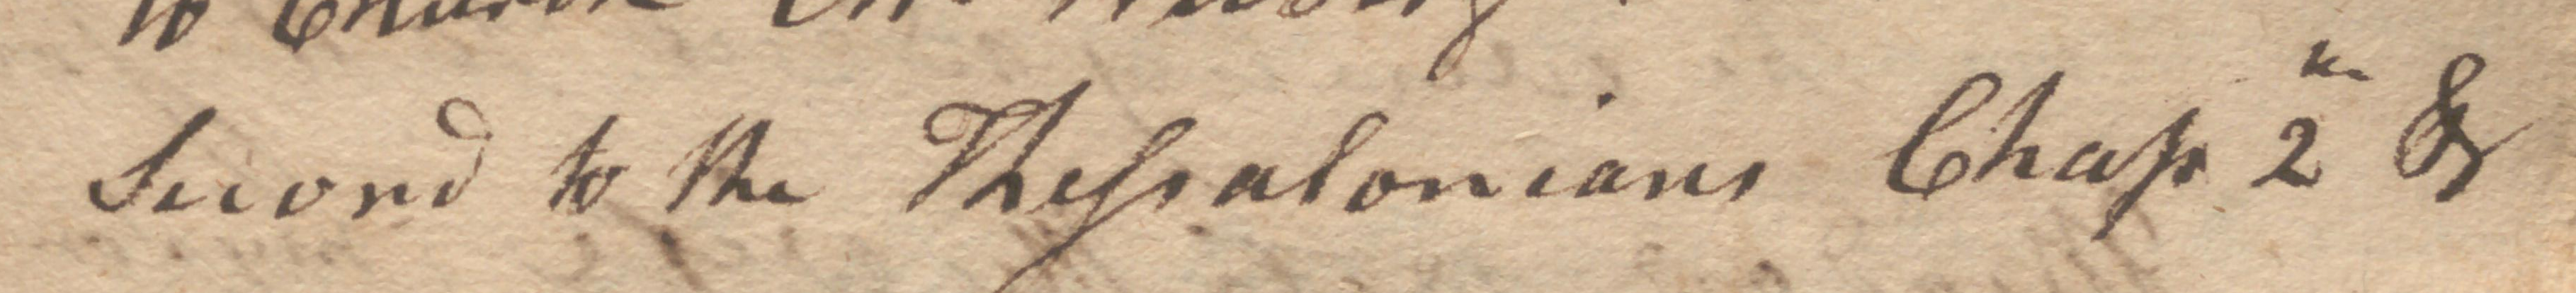second to the Thessalonians Chap 2^th &
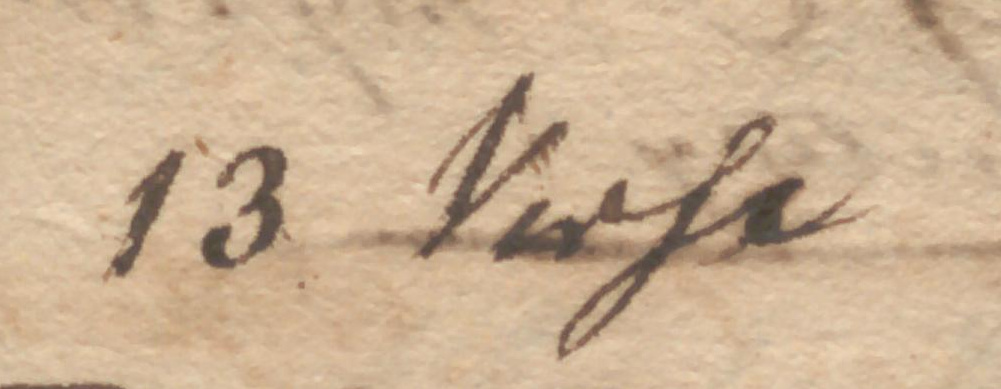13 Verse
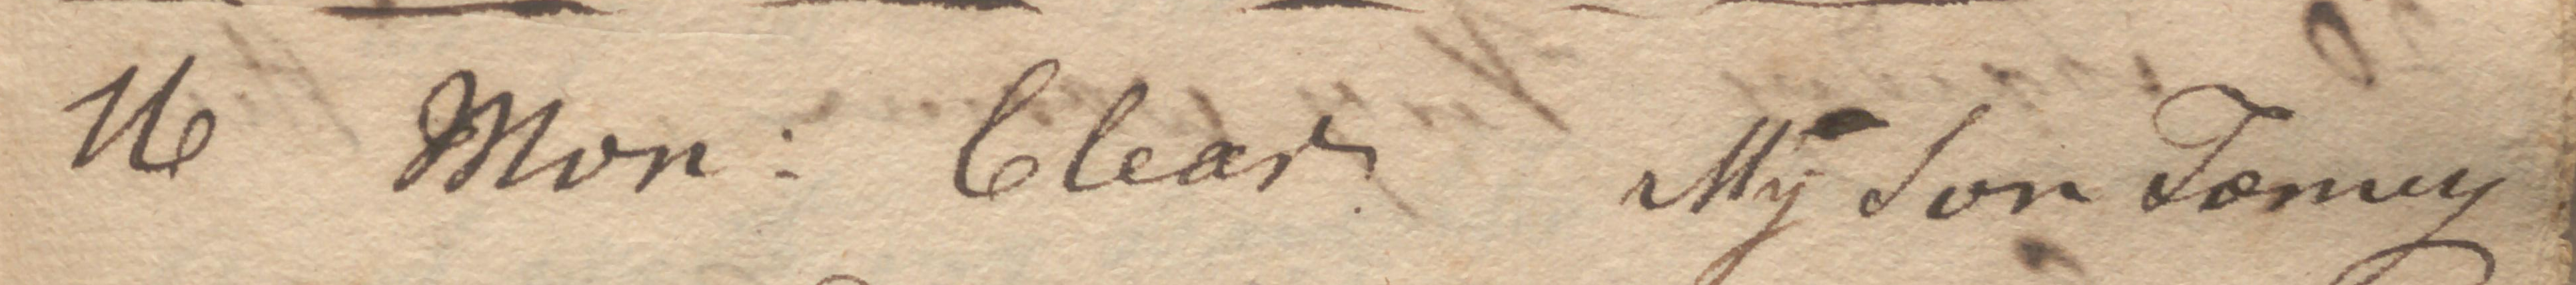16 Mon. Clear My Son Tomey
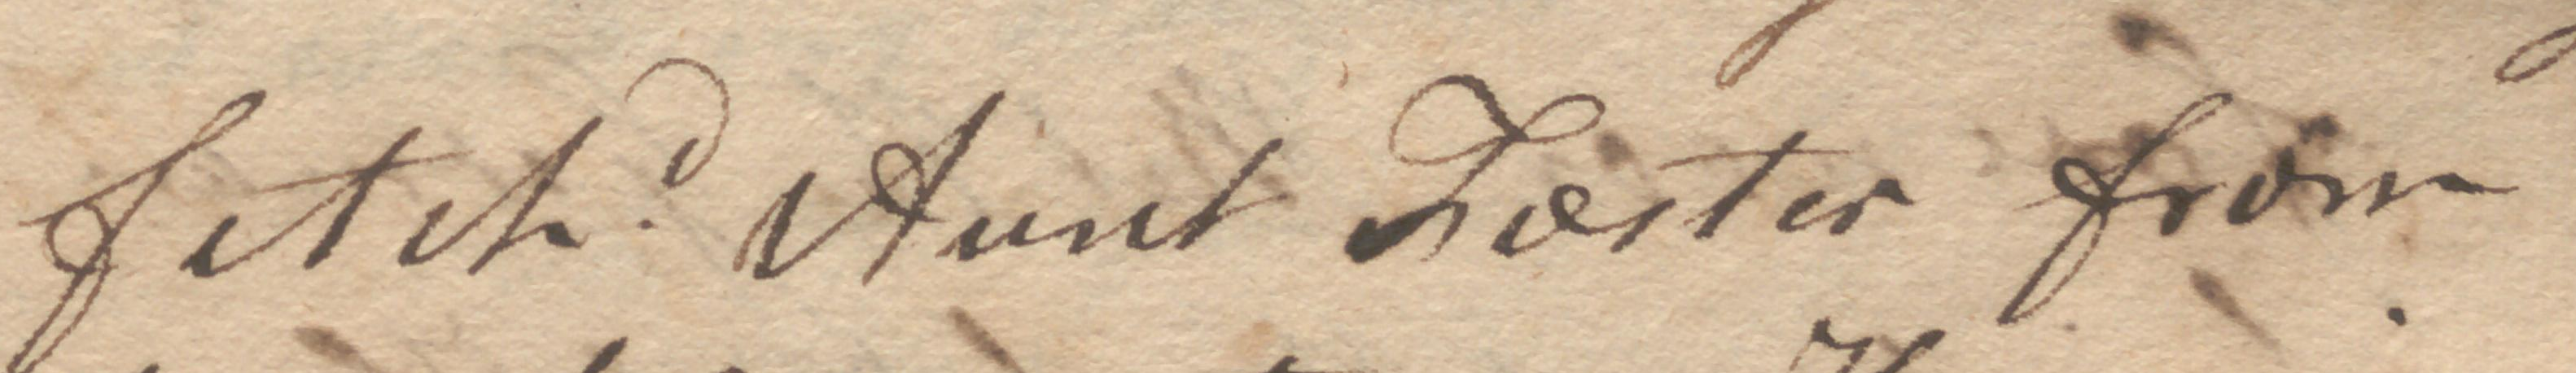fetch^d. Aunt Foster from
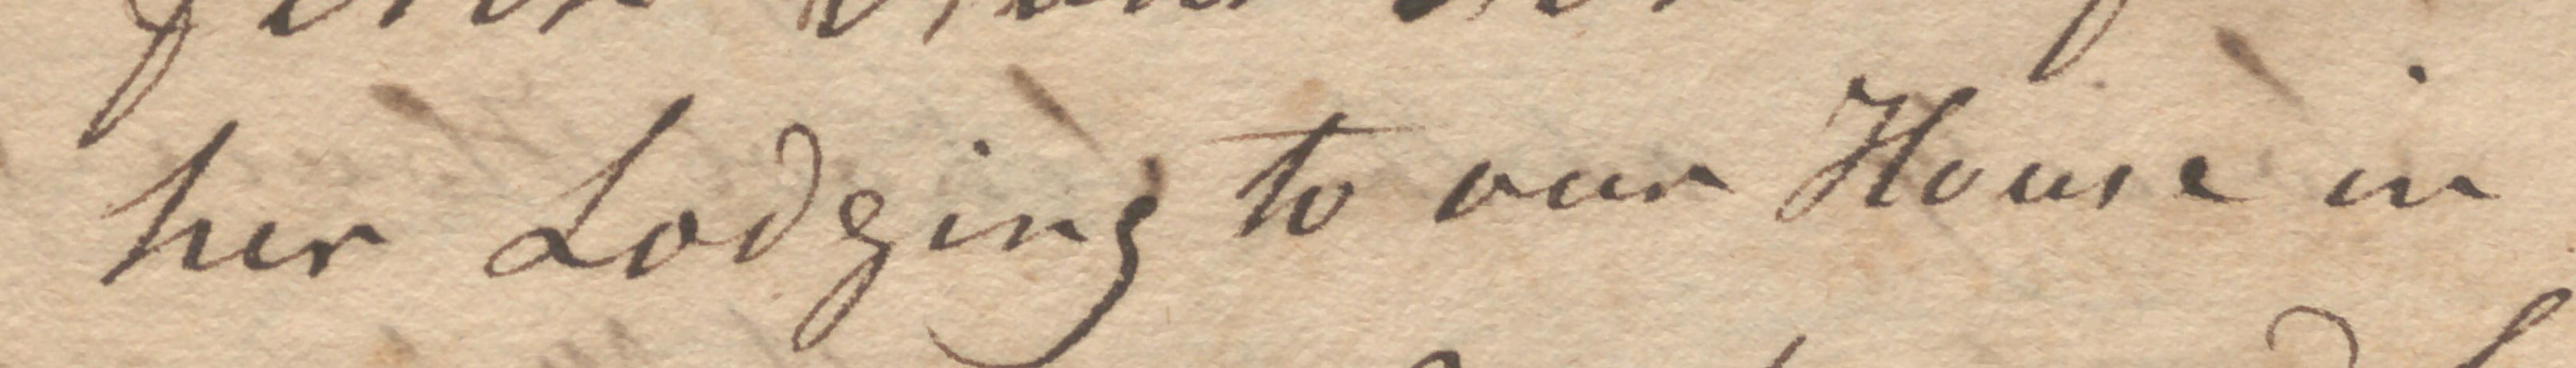her Lodging to our House in
